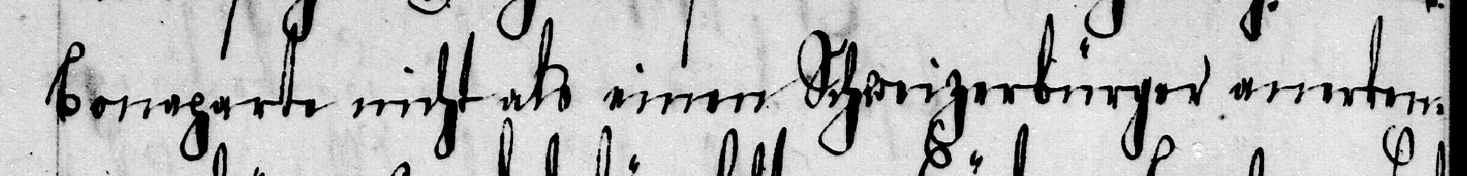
Bonaparte nicht als einen Schweizerbürger anerken¬
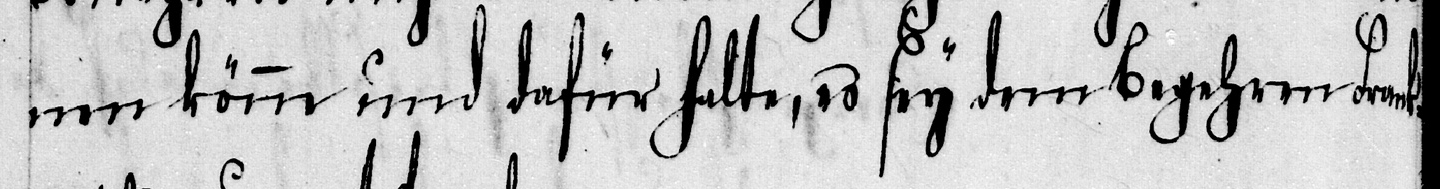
nen könne und dafür halte, es sey dem Begehren Fra¬
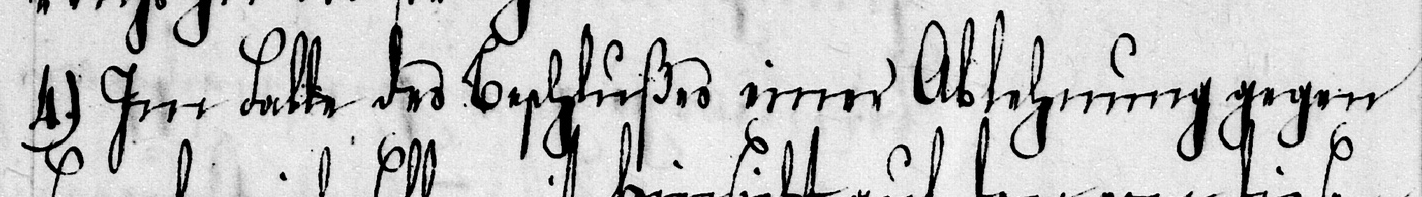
4.) Im Falle des Beschlußes einer Ablehnung gegen
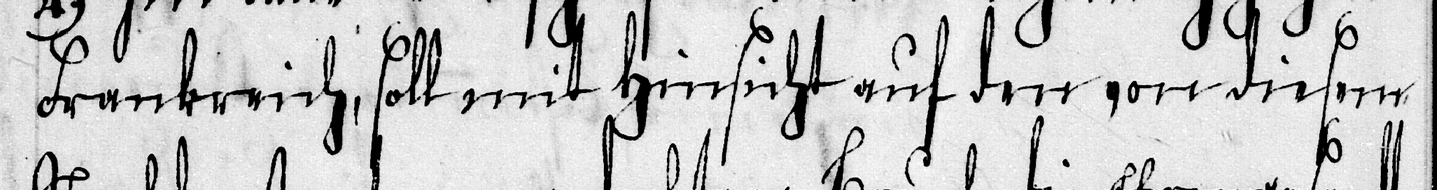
Frankreich, soll mit Hinsicht auf den von diesem
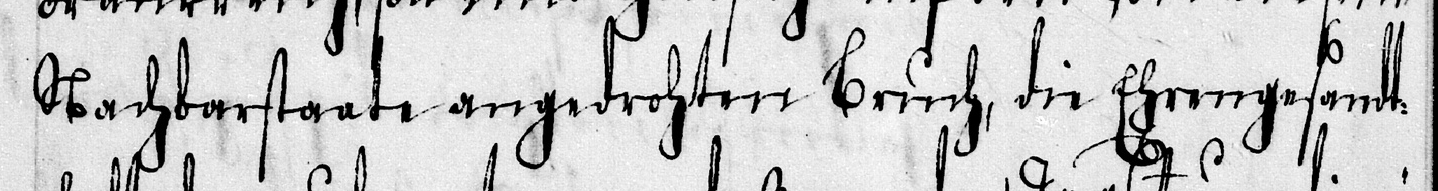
Nachbarstaate angedrohten Bruch, die Ehrengesandt¬
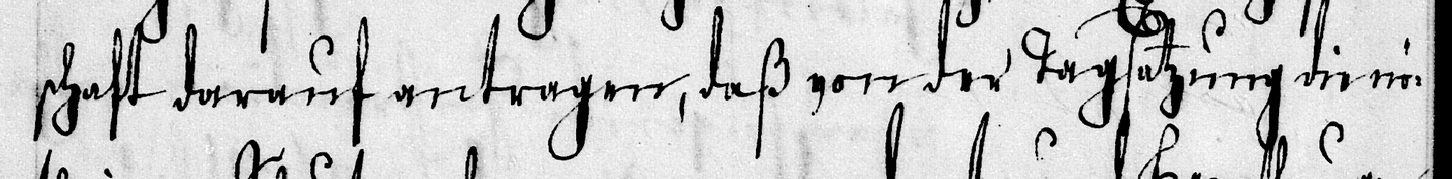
schaft darauf antragen, daß von der Tagsatzung die n¬
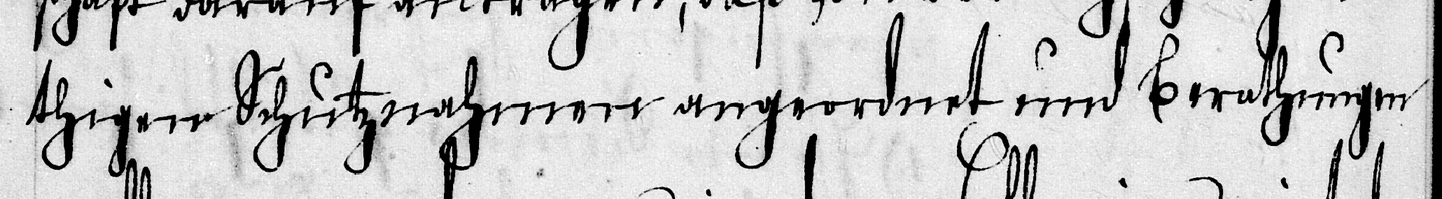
öthigen Schutznahmen angeordnet und Berathungen
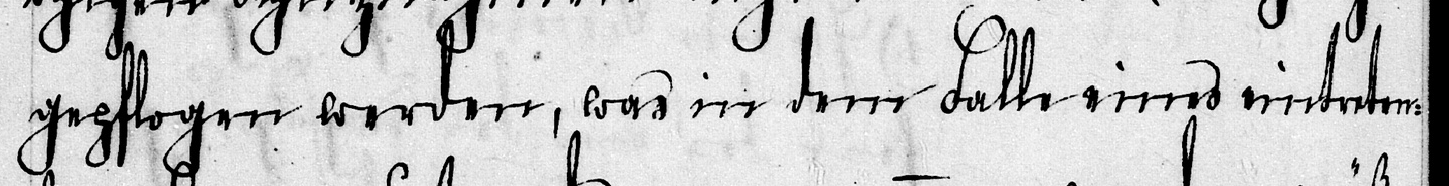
gepflogen werden, was in dem Falle eines eintreten¬
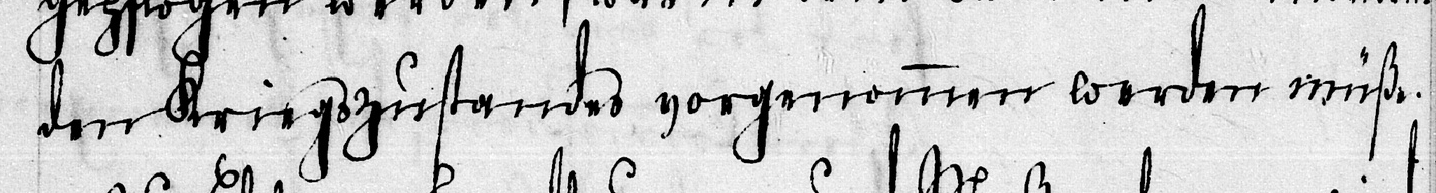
den Kriegszustandes vorgenommen werden müße.
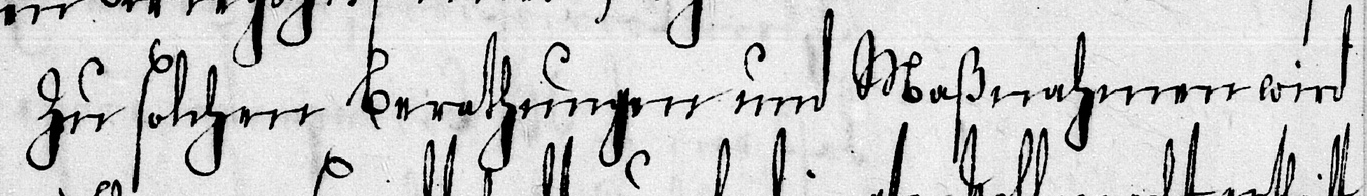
Zu solchen Berathungen und Maßnahmen wird
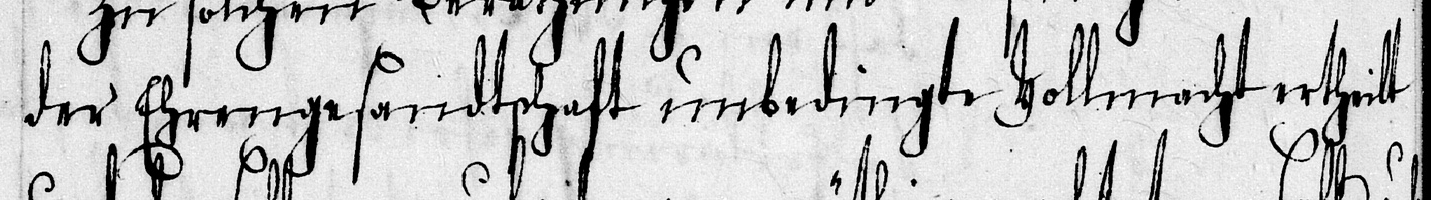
der Ehrengesandtschaft unbedingte Vollmacht erthe¬
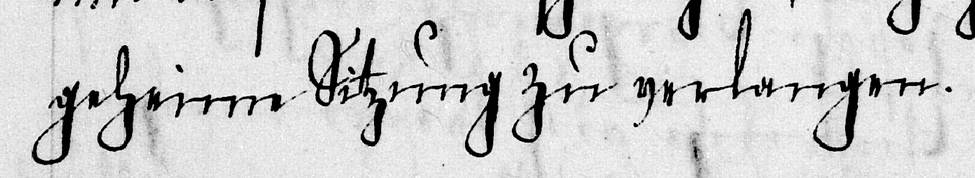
geheime Sitzung zu verlangen.
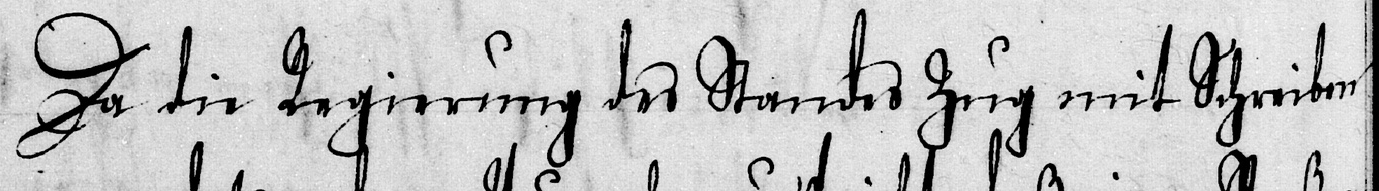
Da die Regierung des Standes Zug mit Schreiben
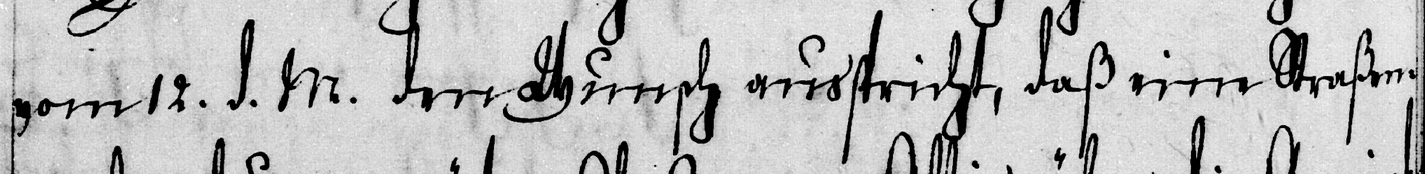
vom 12. d. M. den Wunsch ausspricht, daß eine Straßen¬
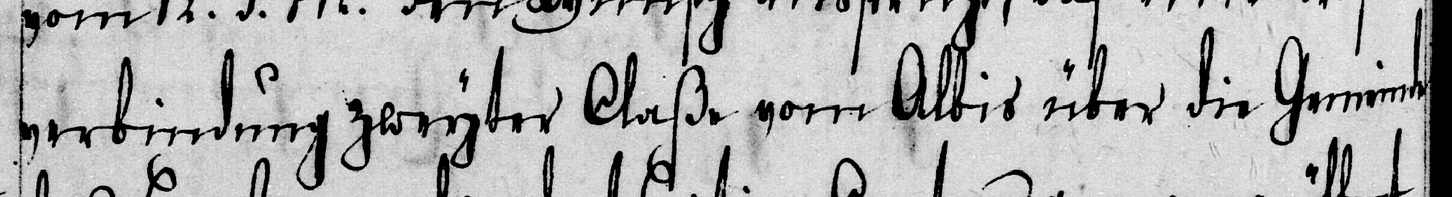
verbindung zweyter Claße vom Albis über die Gemeinde
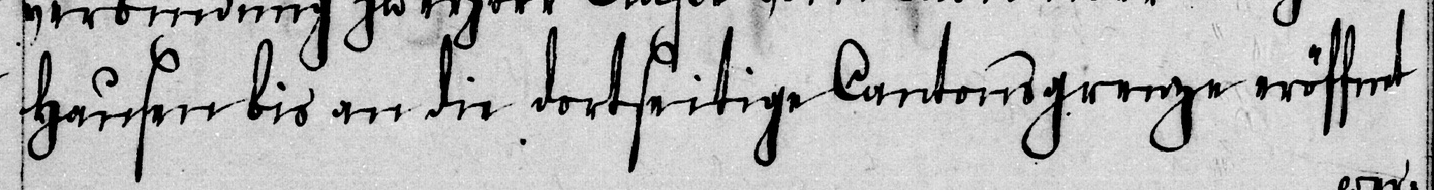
Hausen bis an die dortseitige Cantonsgrenze eröffnet
